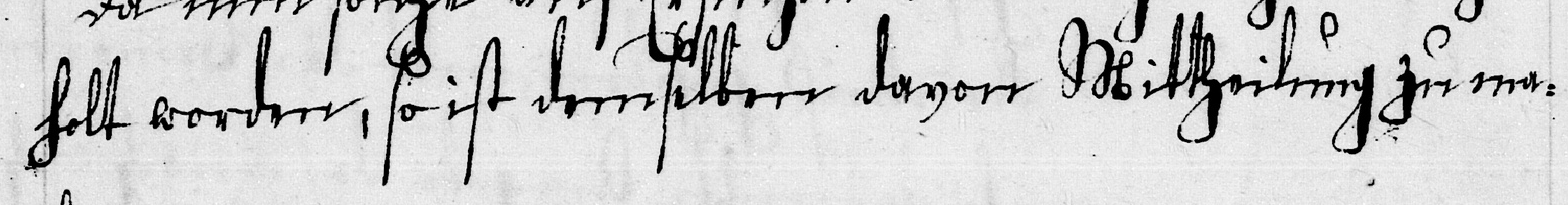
holt worden, so ist demselben davon Mittheilung zu ma¬
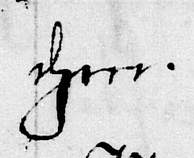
chen.
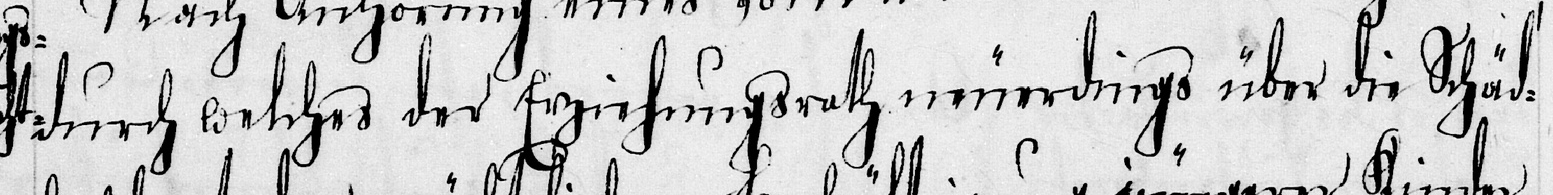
durch welches der Erziehungsrath neuerdings über die Schäd¬
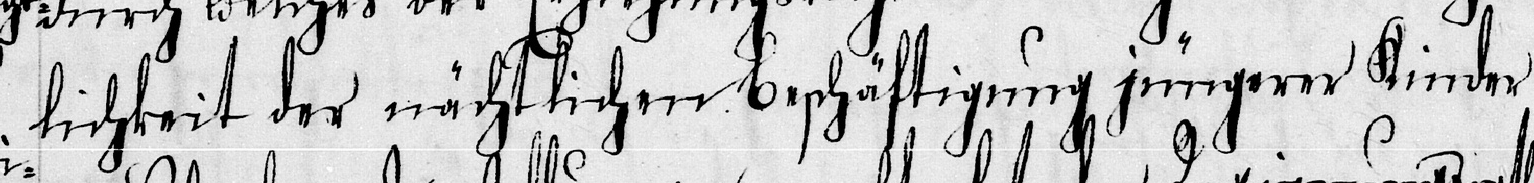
lichkeit der nächtlichen Beschäftigung jüngerer Kinder
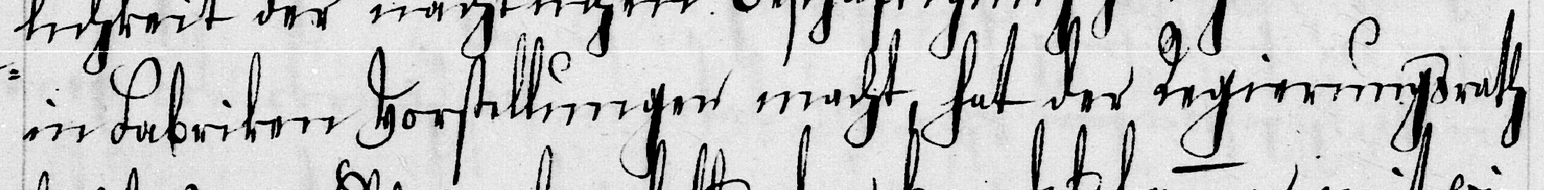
den Fabriken Vorstellungen macht, hat der Regierungsrath
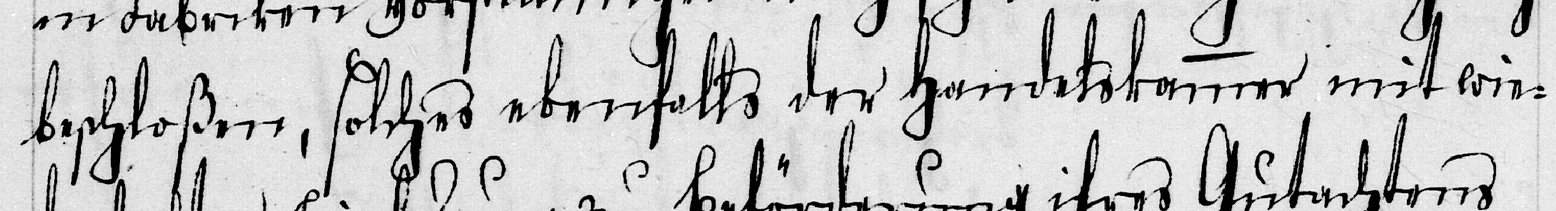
beschloßen, solches ebenfalls der Handelskammer mit wie¬
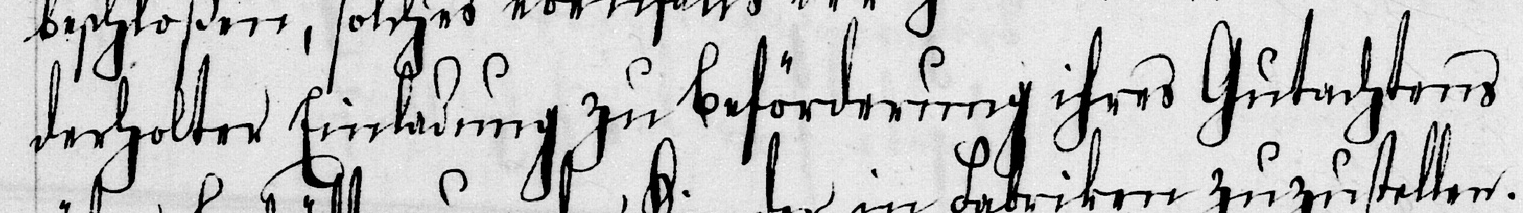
derholter Einladung zu Beförderung ihres Gutachtens
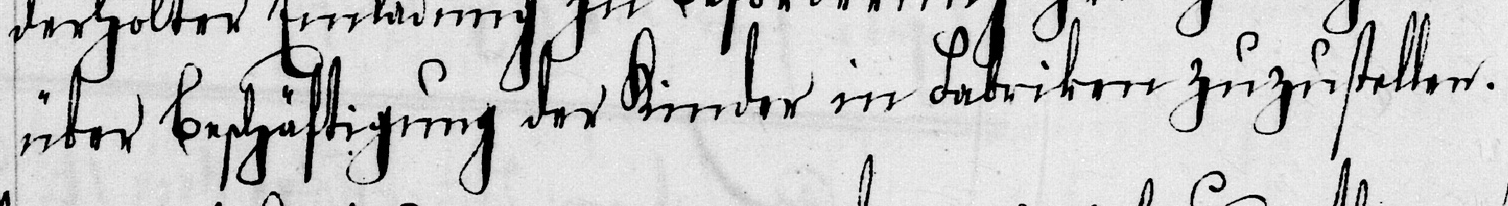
über Beschäftigung der Kinder in Fabriken zuzustellen.
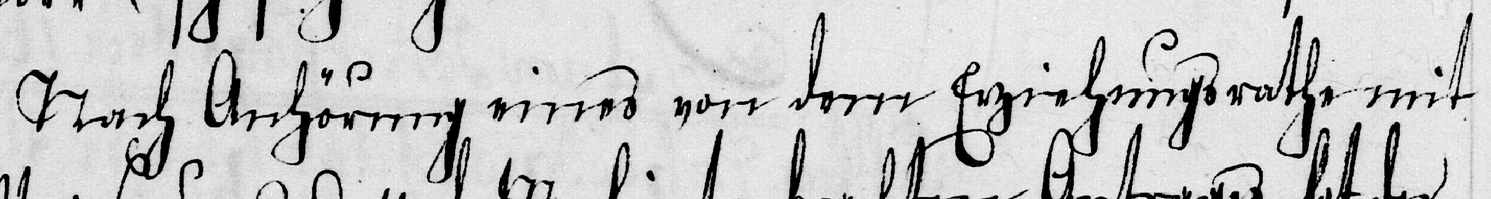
Nach Anhörung eines von dem Erziehungsrathe mit
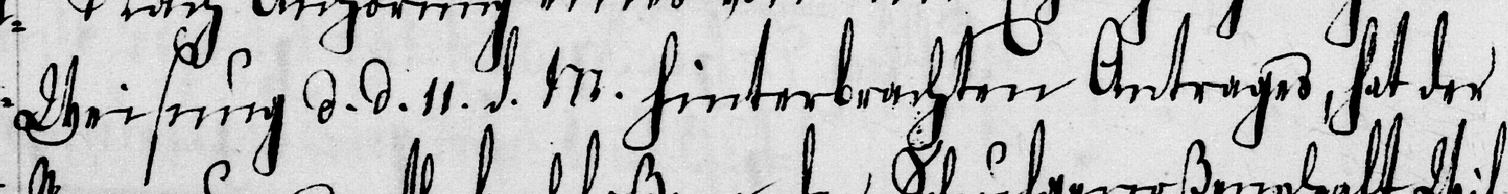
Weisung d. d. 11. d. M. hinterbrachten Antrages, hat der
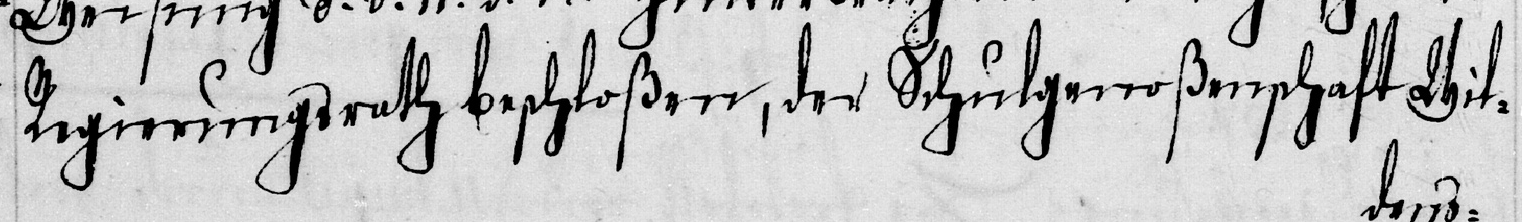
Regierungsrath beschloßen, der Schulgenoßenschaft Wil-
